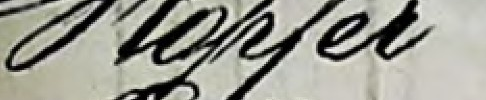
Hopfer
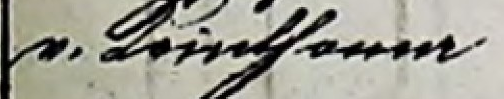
v. Krinthanen
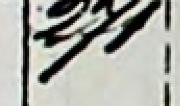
271
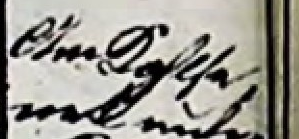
Am Kohlse„
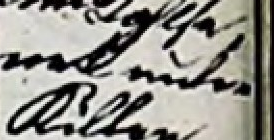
nek unter
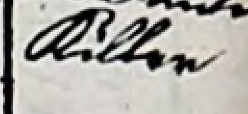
Killer
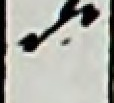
Do
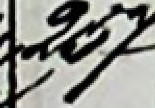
257
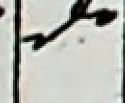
Do
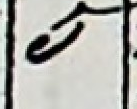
5
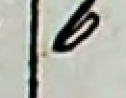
6
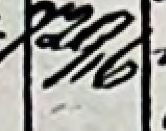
729,6
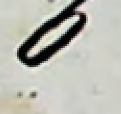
6
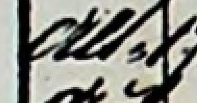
Alt„
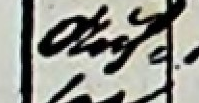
Aus„
